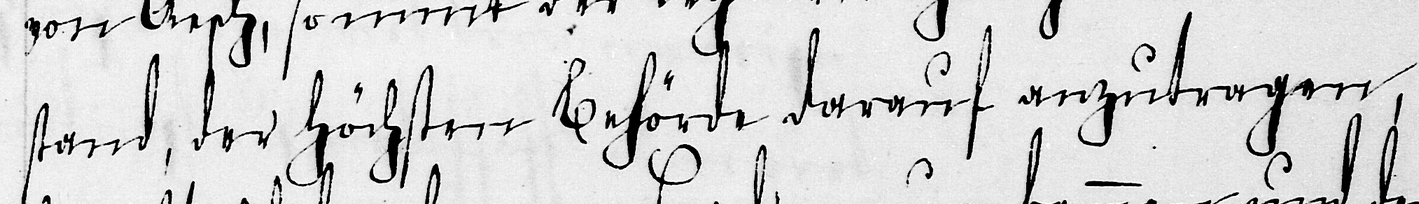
stand, der Höchsten Behörde darauf anzutragen,
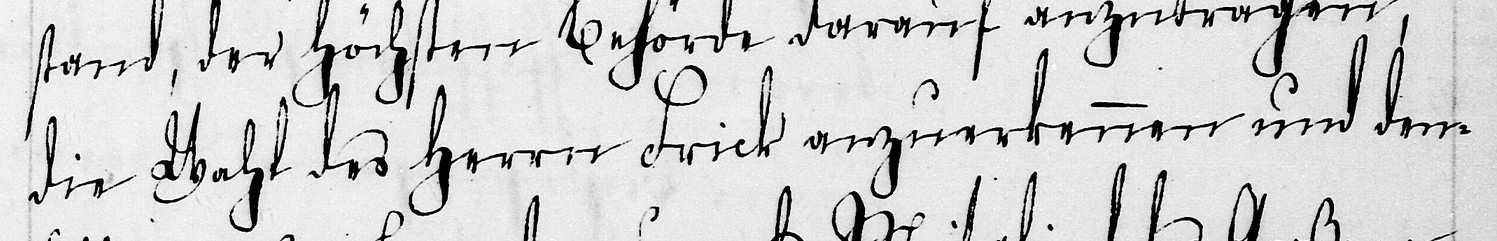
die Wahl des Herrn Frick anzuerkennen und den¬
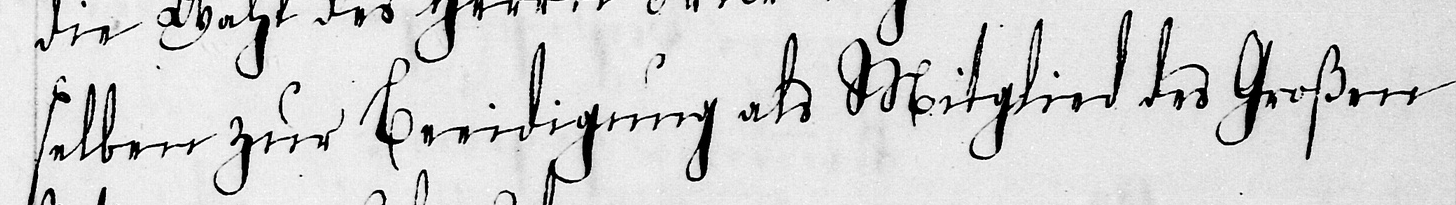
selben zur Beeidigung als Mitglied des Großen
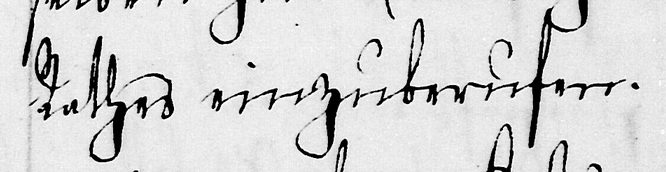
Rathes einzuberufen.
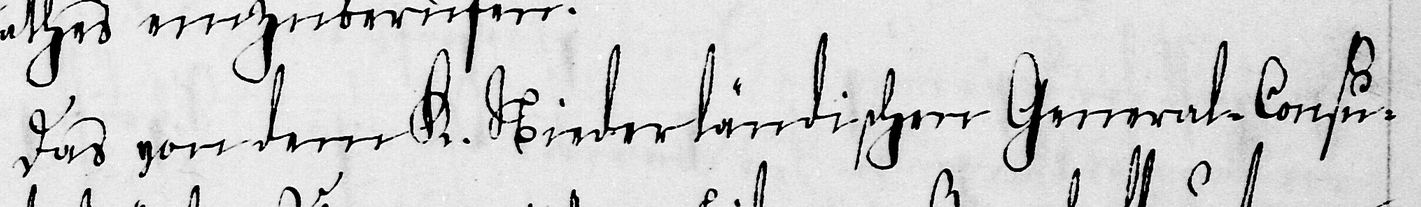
Das von dem K. Niederländischen General-Consu¬
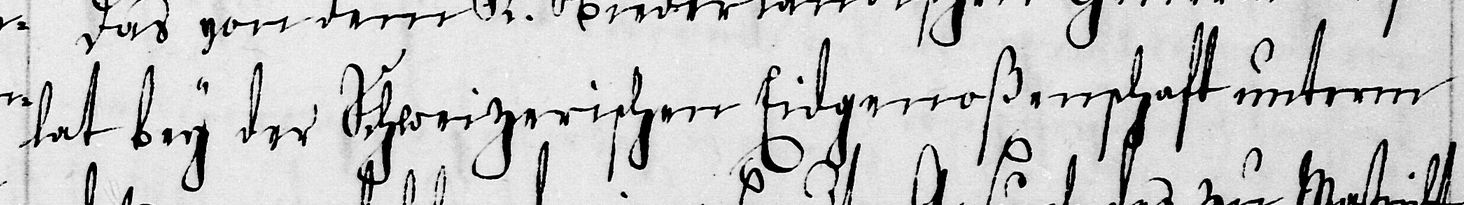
lat bey der Schweizerischen Eidgenoßenschaft unterm
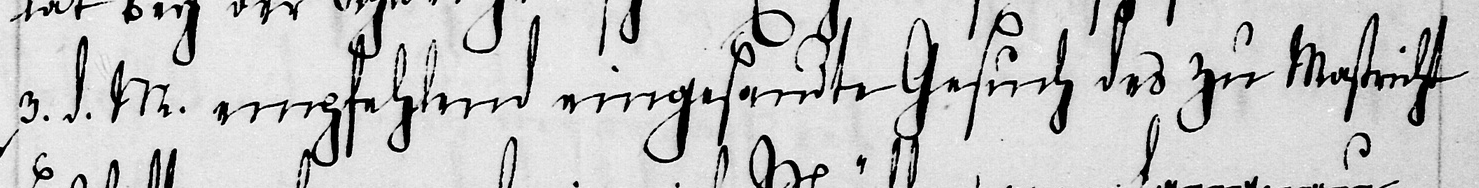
3. d. M. empfehlend eingesandte Gesuch des zu Mastricht
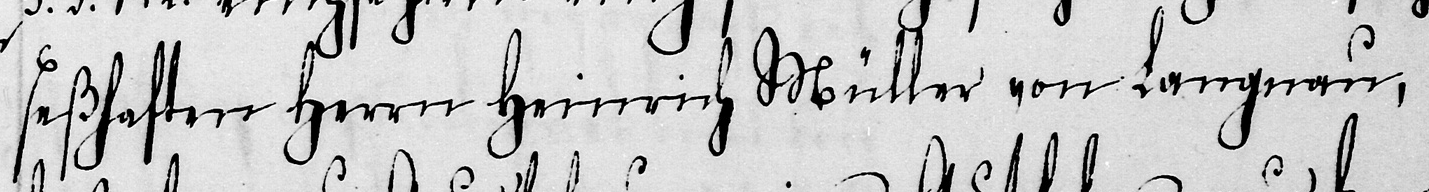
seßhaften Herrn Heinrich Müller von Langnau,
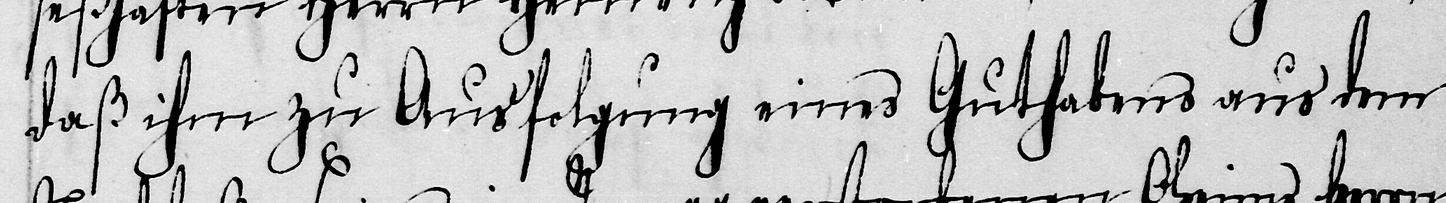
daß ihm zu Ausfolgung eines Guthabens aus dem
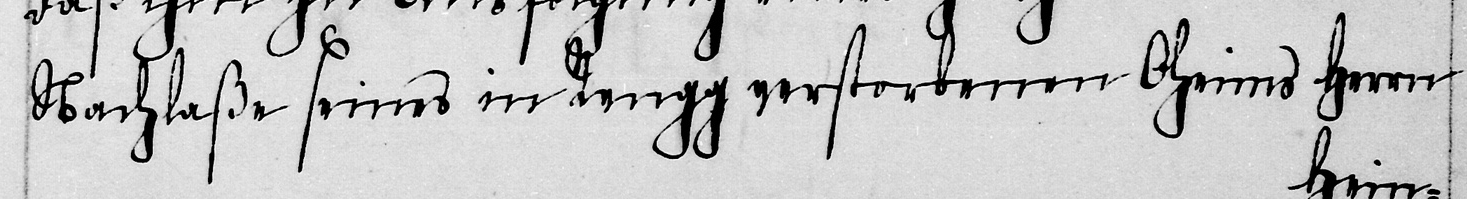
Nachlaße seines in Rengg verstorbenen Oheims Herrn
